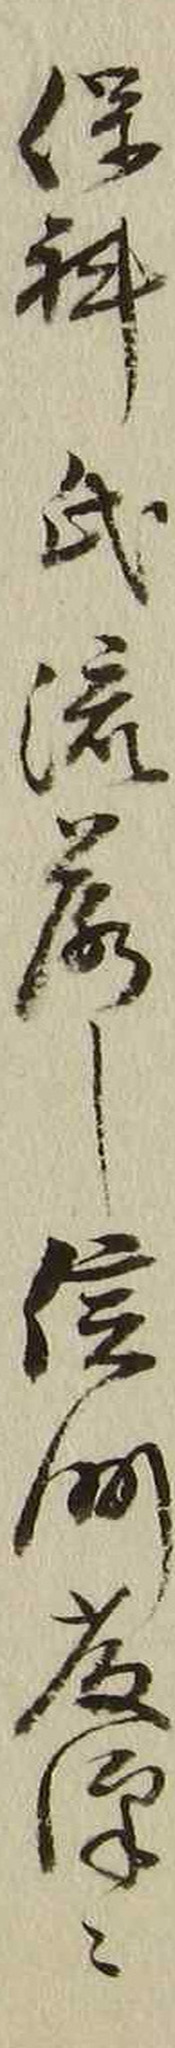保科氏流落し信州藤沢ニ
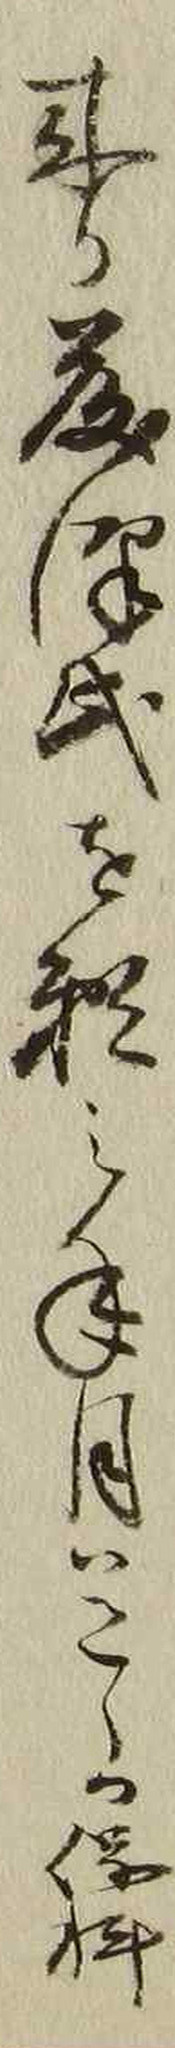来り藤沢氏を頼之年月ハこゝの保科
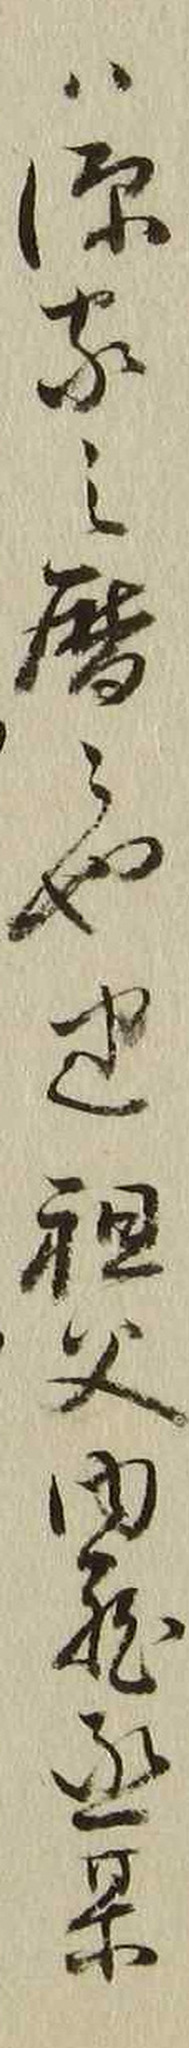ハ源家之暦々也迚祖父内蔵丞某
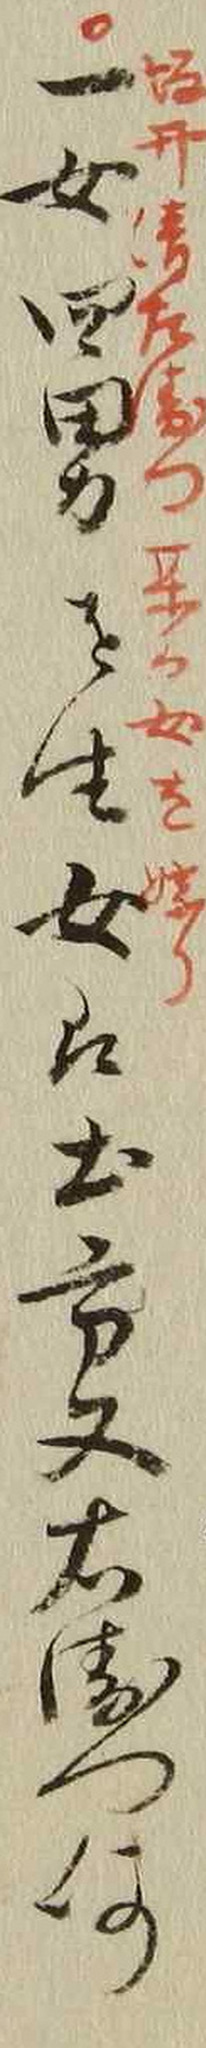一女四男を生女は土方又右衛門何
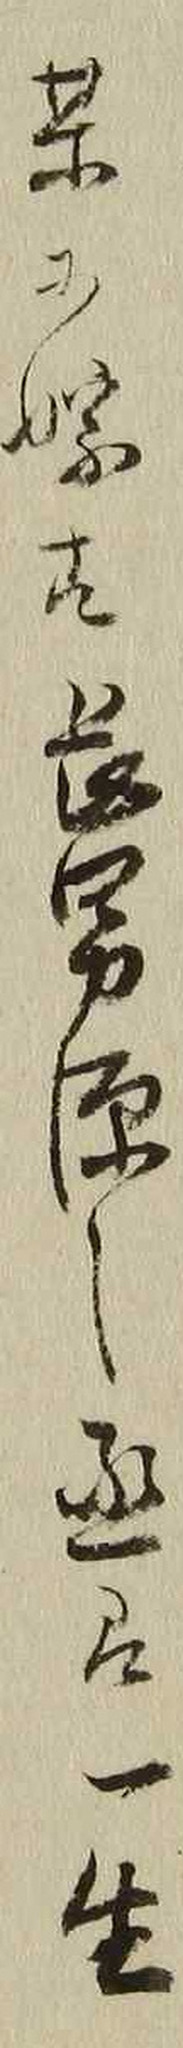某に嫁す長男源之丞は一生
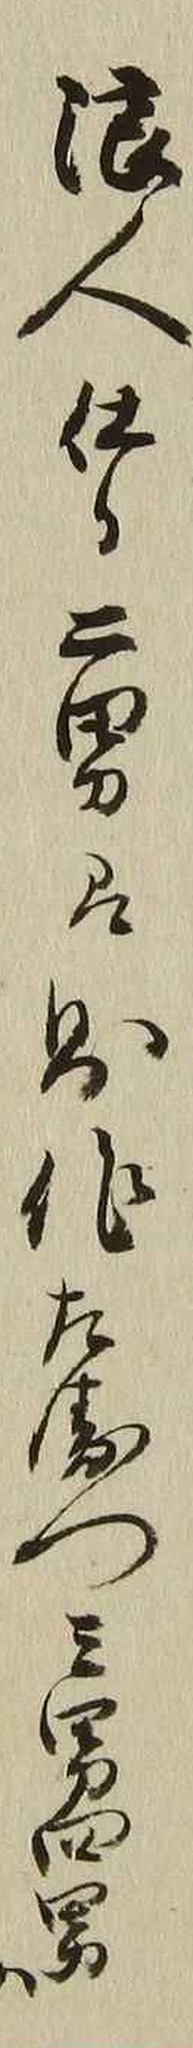浪人仕り二男は則作左衛門三男四男ハ
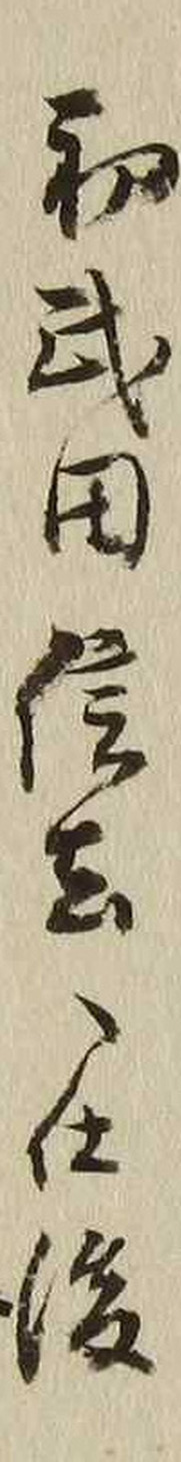初武田信玄へ仕後
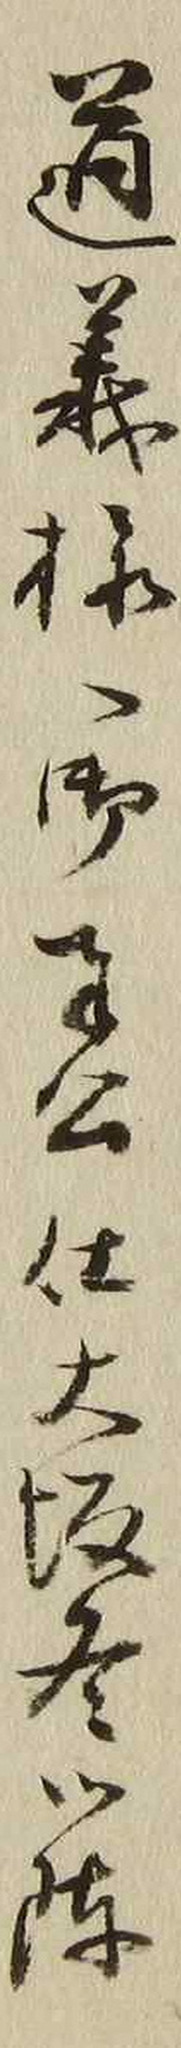道義様へ御奉公仕大坂冬御陣
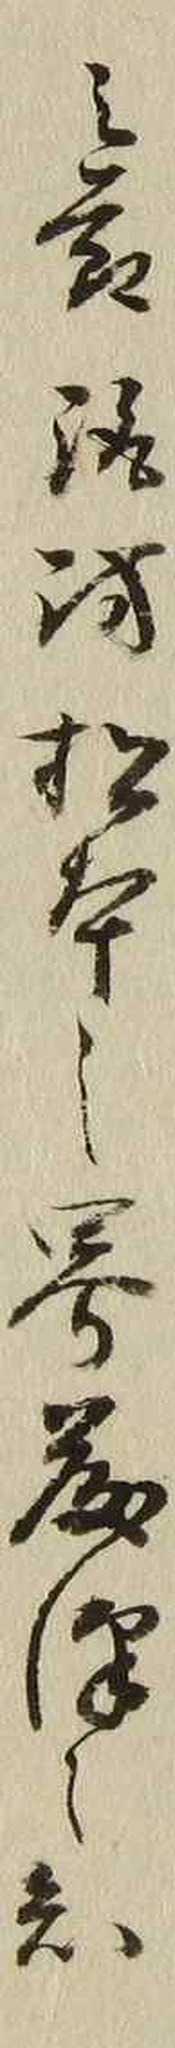之節諏訪松本之界藤沢之知
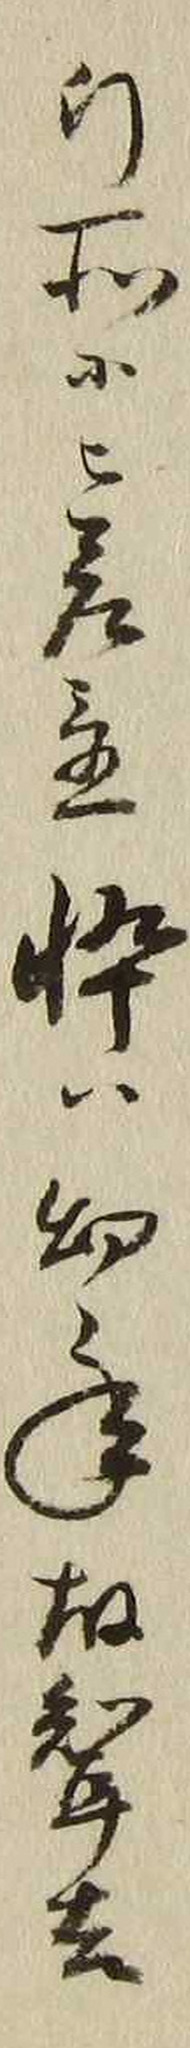行所に被差置忰ハ幼年故婿吉
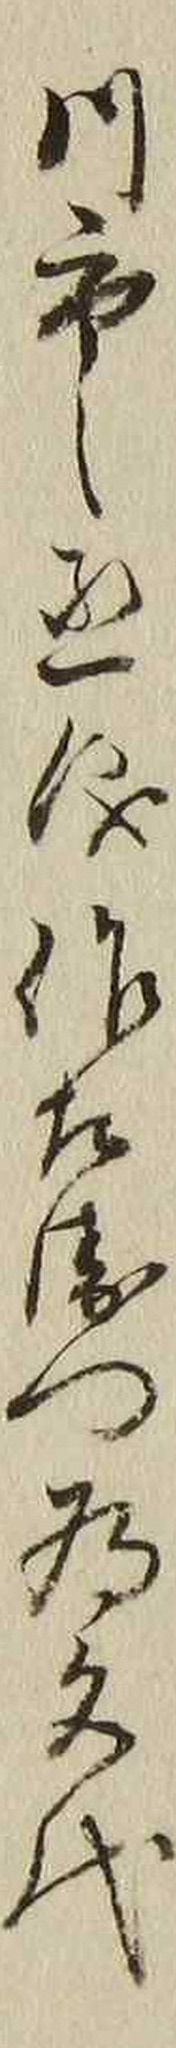川市之丞儀作左衛門為交代
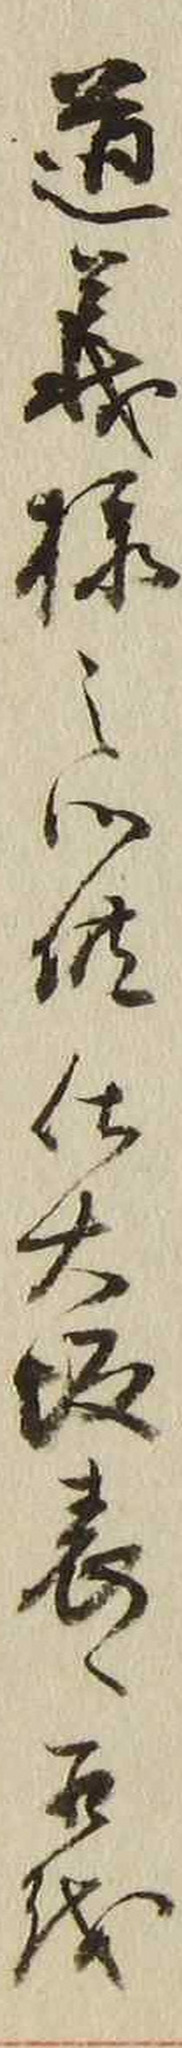道義様之御供仕大坂表へ相越
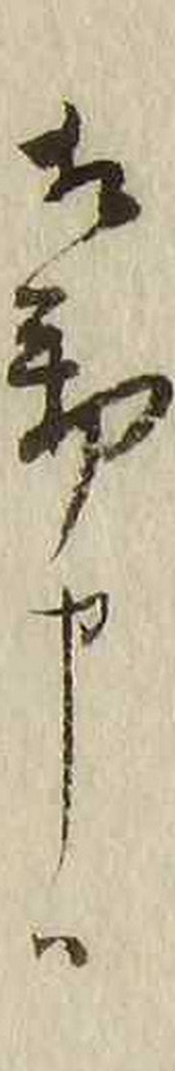相勤申候

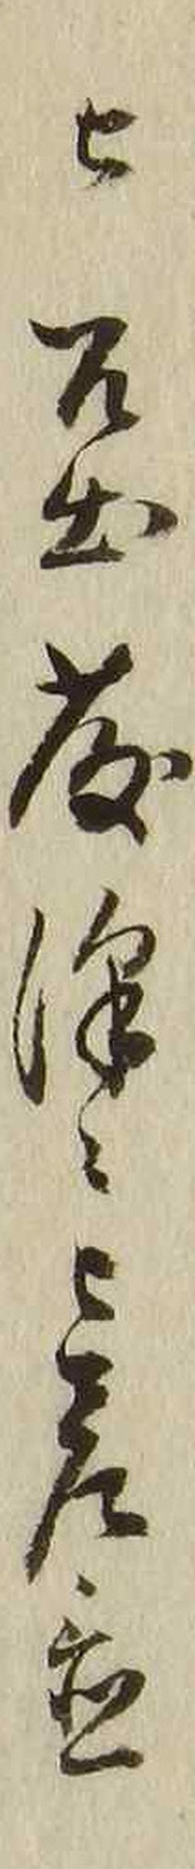被召出藤沢ニ被差置
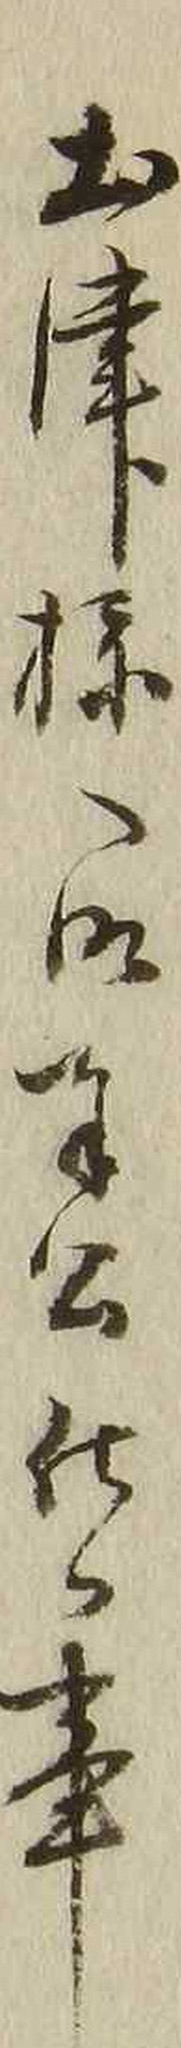土津様へ御奉公仕候事
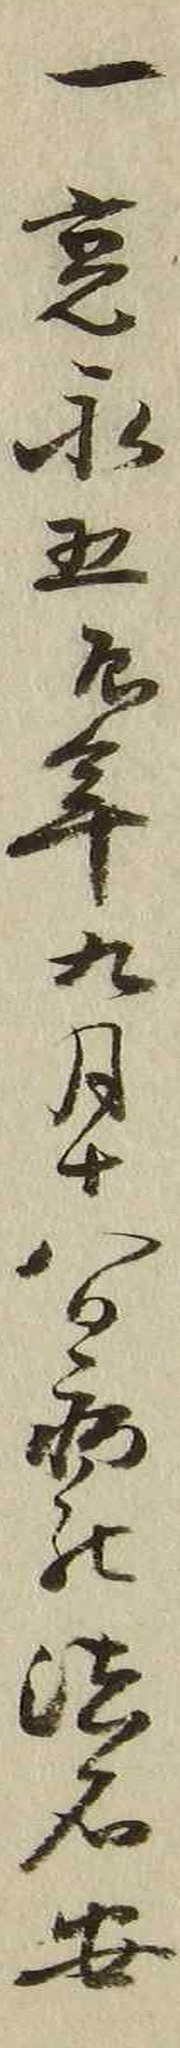一寛永五辰年九月十八日病死法名安
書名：諸士系譜　巻之236　ふ之部4
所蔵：会津若松市立会津図書館
